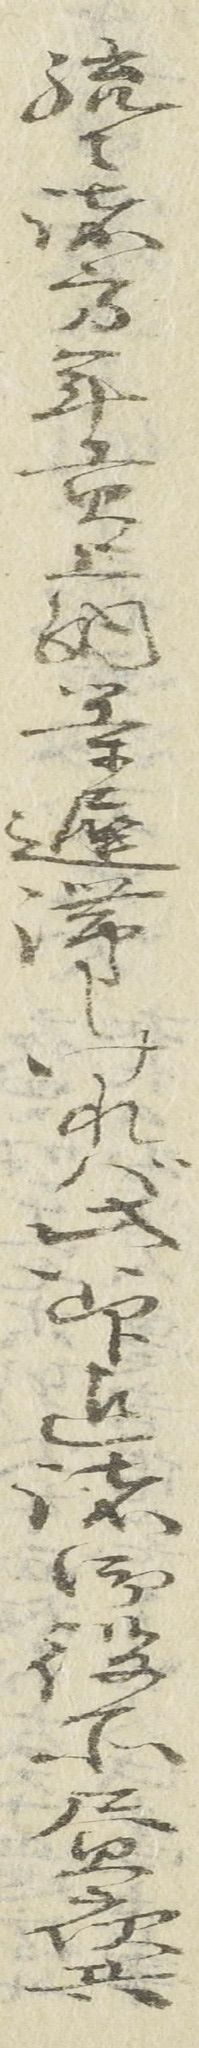統て諸方年貢上納等遅滞しけれバ此節迄諸御役所昼夜共
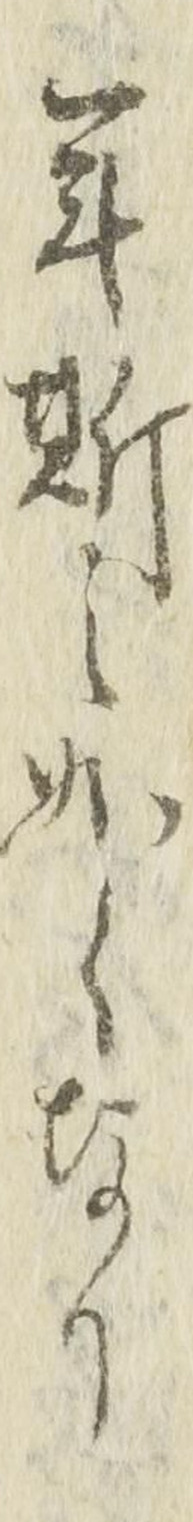年斯之如くなり
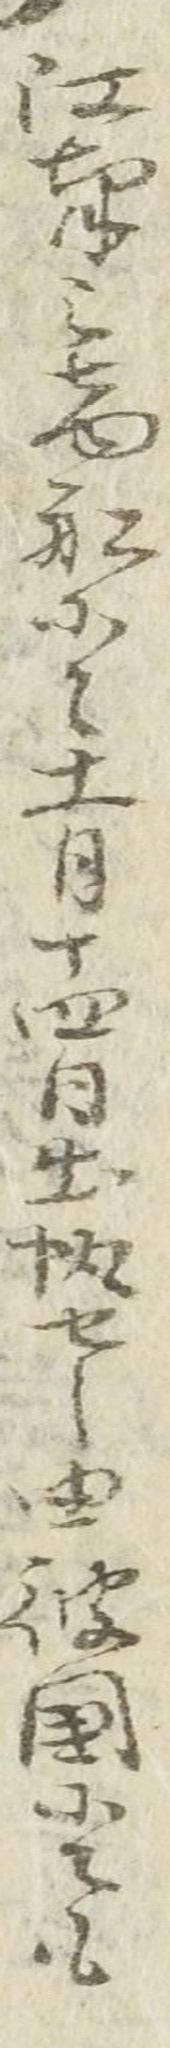る江南之商船にて十一月十四日出帆セし由彼国にても
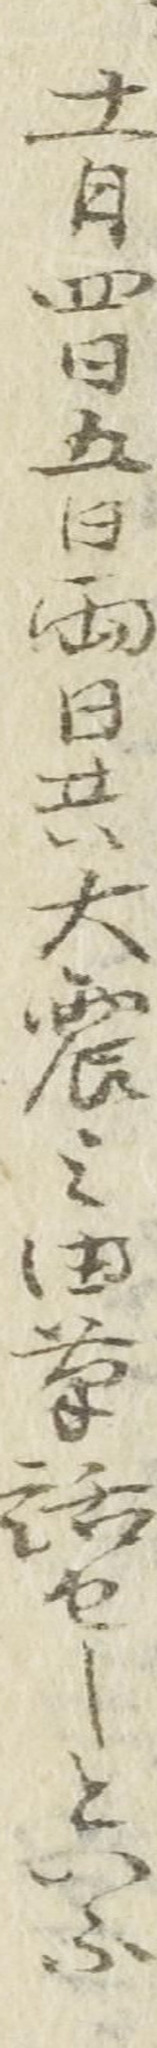十一月四日五日両日共大震之由草話セしといふ
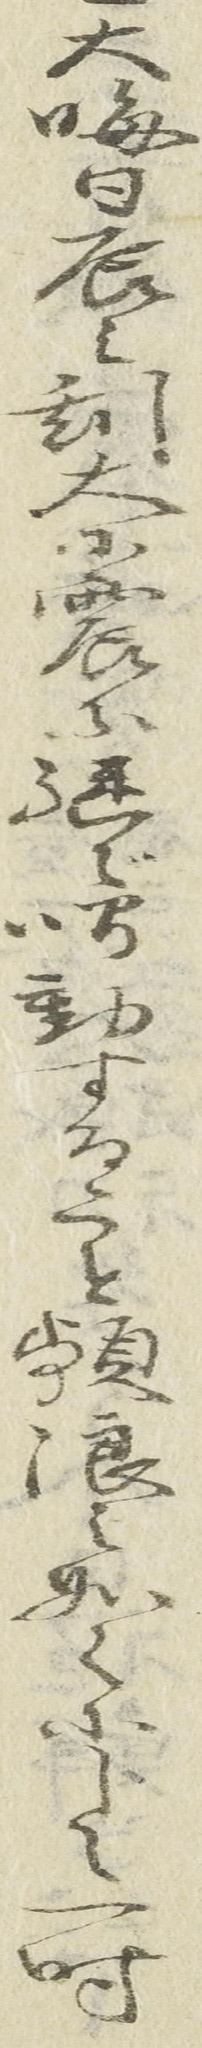、大晦日辰之刻大に震ふ継で鳴動するゝこと頻浪之如くにして一時
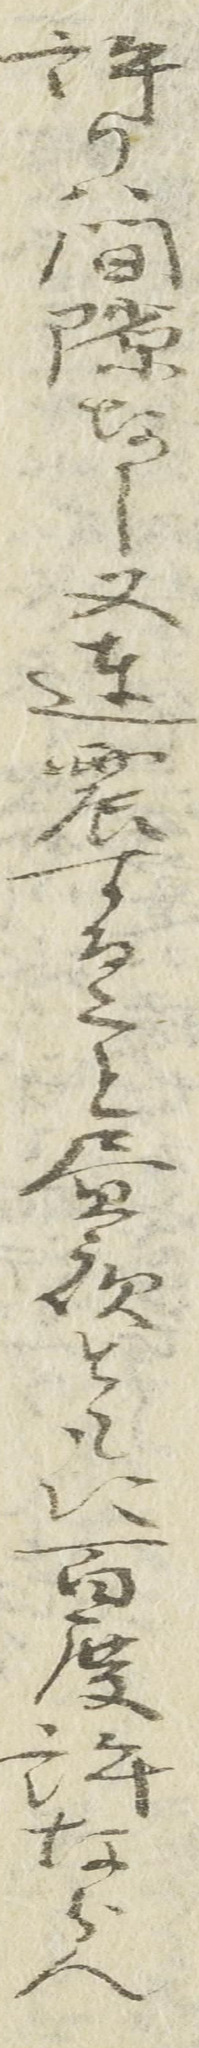許りハ間隙なし又連震すること昼夜ともに百度許ならん
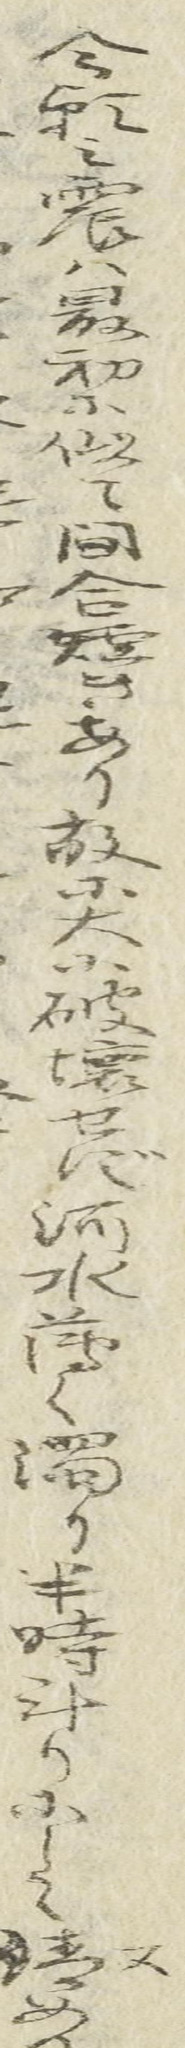今朝之震ハ最初に似て間合短きあり故に大に破壊セず河水薄く濁り半時計りにして清めり
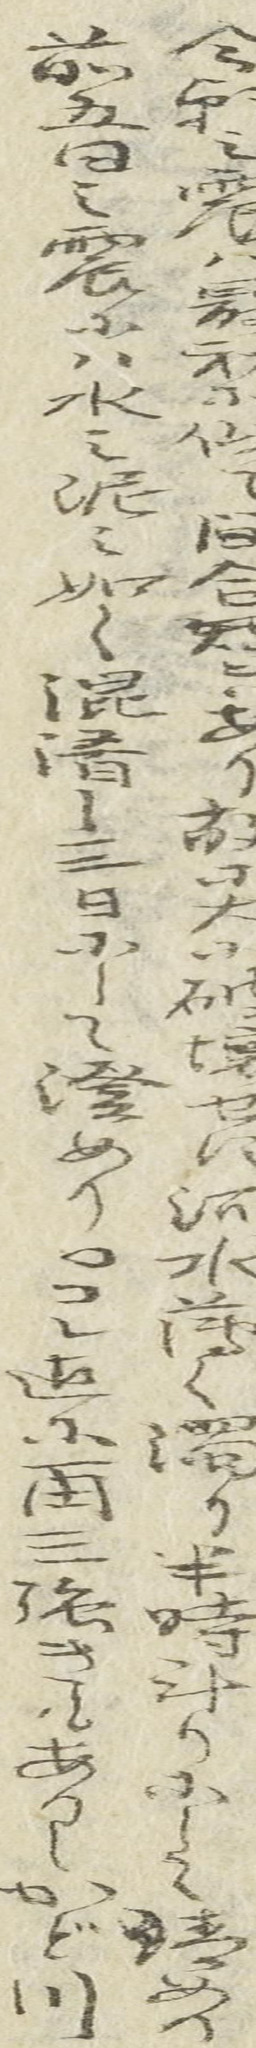前五日之震にハ水之泥之如く混淆し三日にして澄めり○コレ迄に再三強きもありしかど川
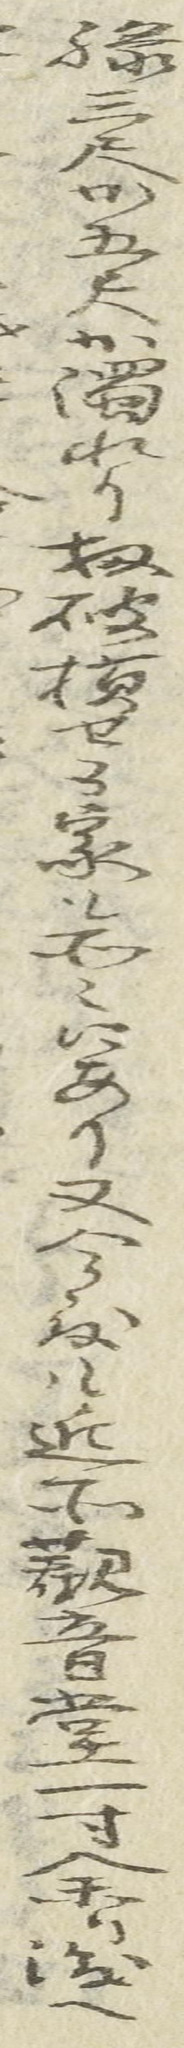縁三尺か五尺か濁れり扨破損セる家も所〻にあり又今度も近所観音堂一寸余り後へ
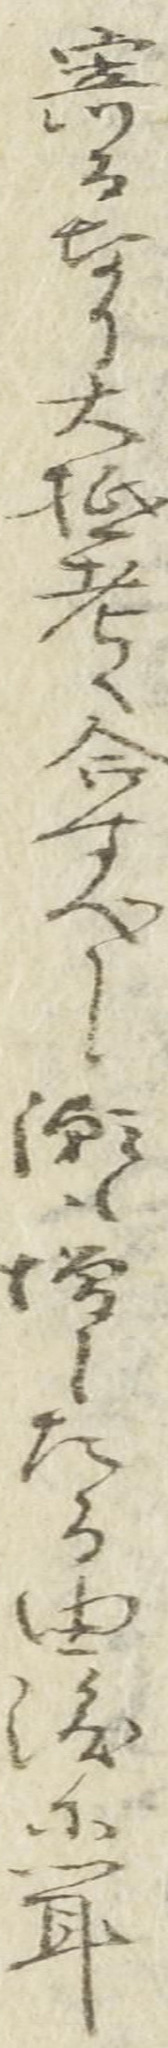寄るなり大抵考へ合すべし潮も増したる由後に聞
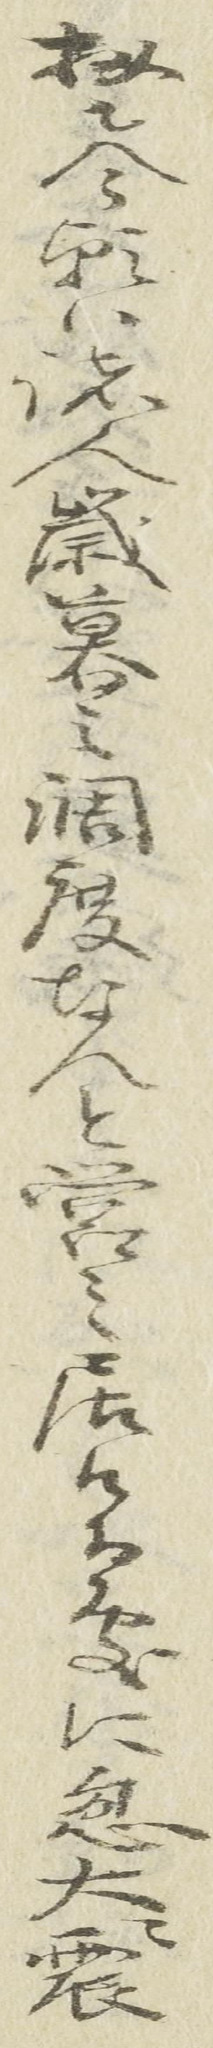扨も今朝ハ諸人歳暮之調度なんと営ミ居ける処に忽大ニ震
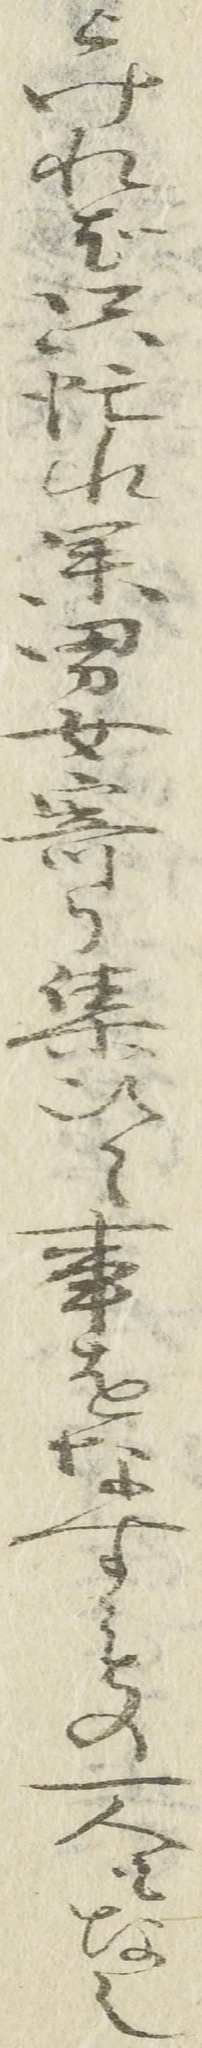被ければ只忙れ果男女寄り集ひし事をなすもの一人もなし
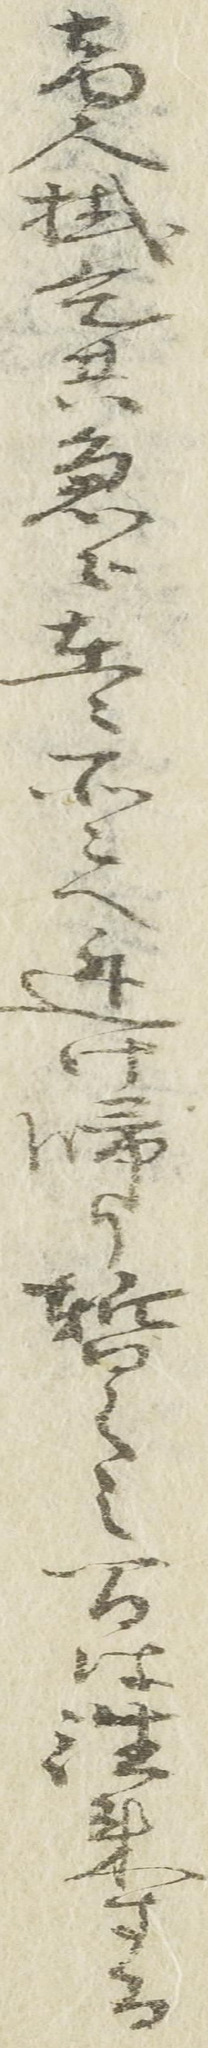商人掛乞共急で在〻所〻へ逃け帰り暫く之間は往来する
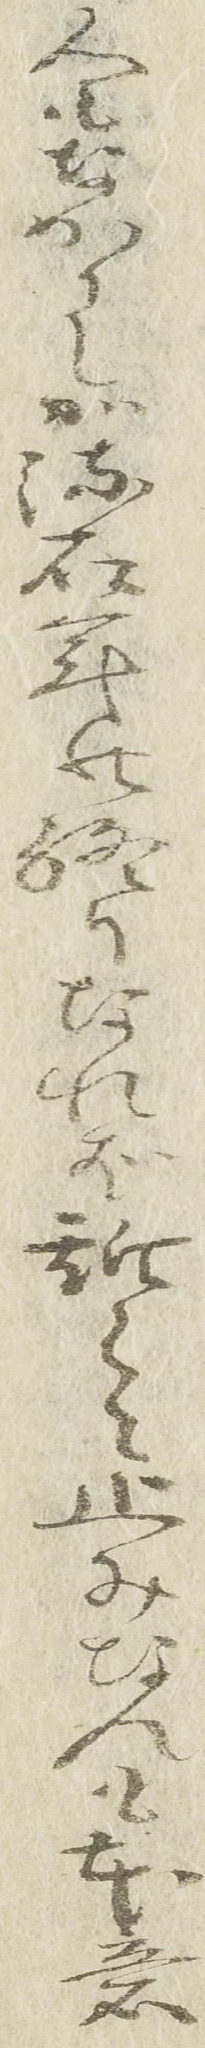人もなかりしが流石年の終りなれば斯くて止みなんも本意
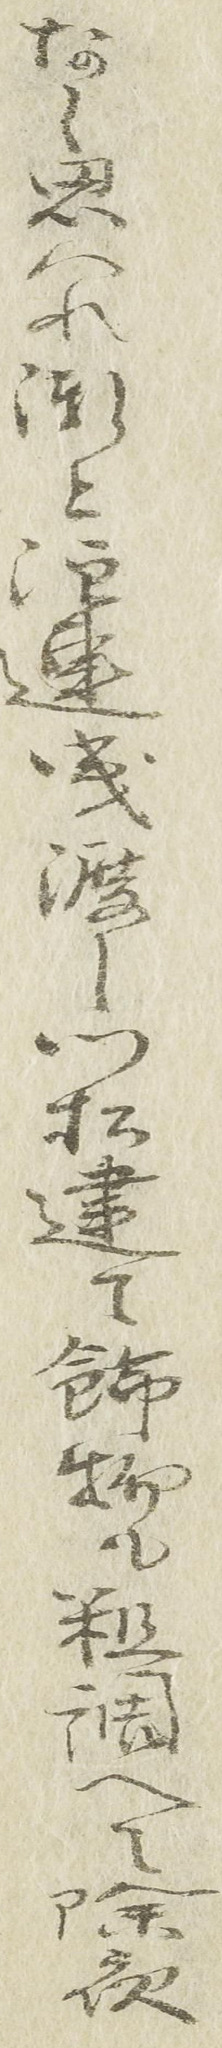なく思ハれ漸と浪速曳渡し門松建て飾物も粗調へて除夜
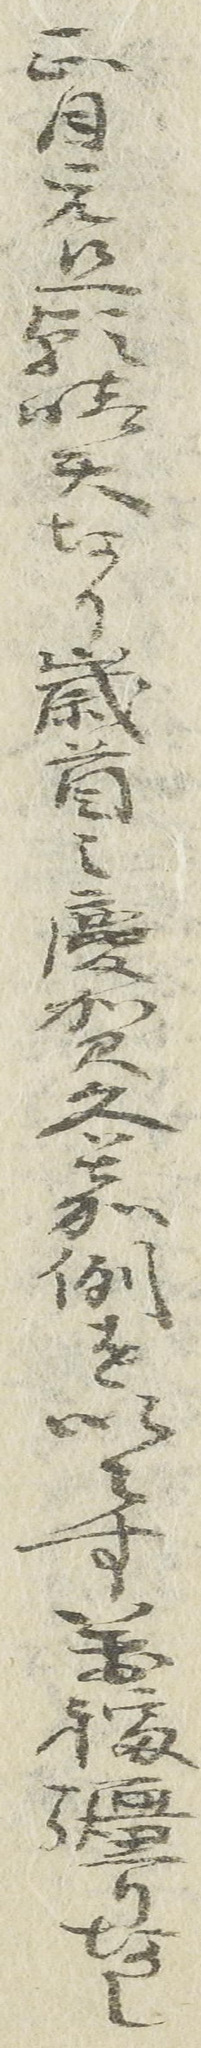正月元旦朝晴天なり歳首之慶賀各嘉例を以てす萬襠彊りなし
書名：地震前兆集　全
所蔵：東京大学地震研究所図書室 Earthquake Research Institute Library, The University of Tokyo, JAPAN
